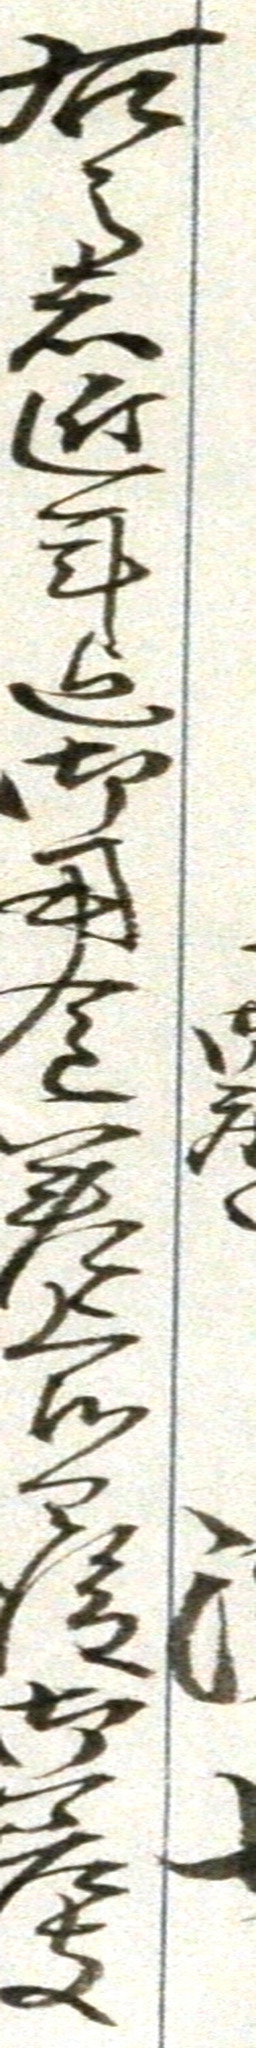右之者近年迄御用金差上候已後御差支
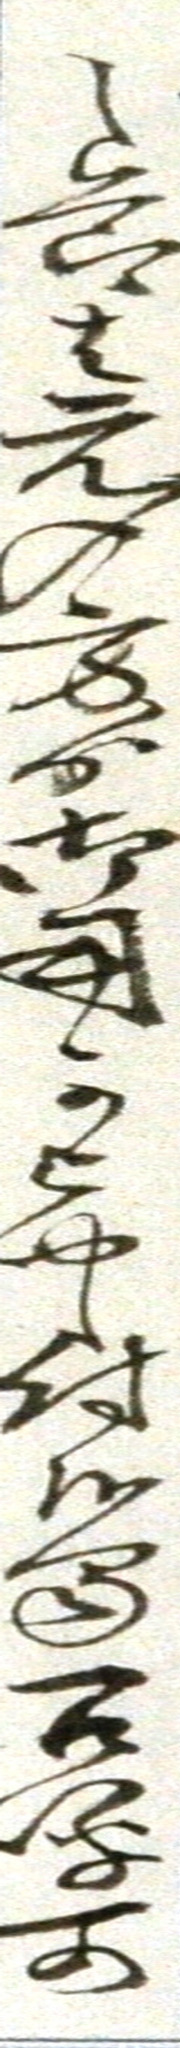之節者元〆方ゟ御用可被申付候間召呼可
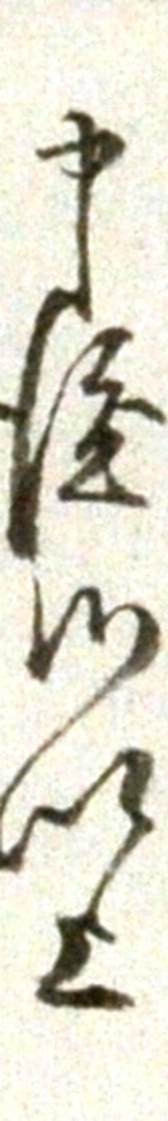申渡候以上
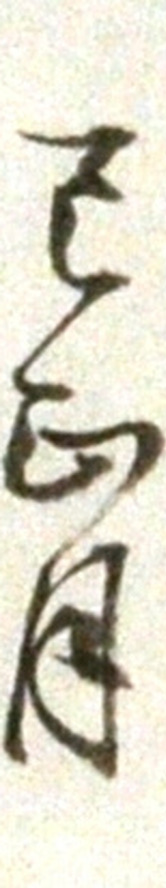巳正月
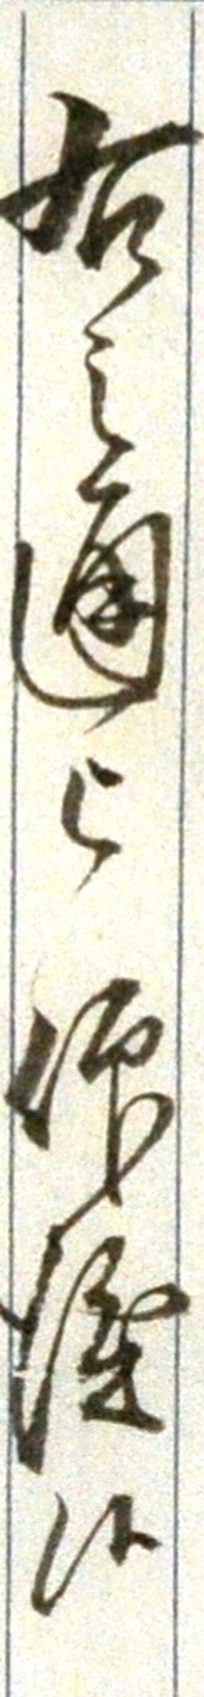右之通被仰渡候
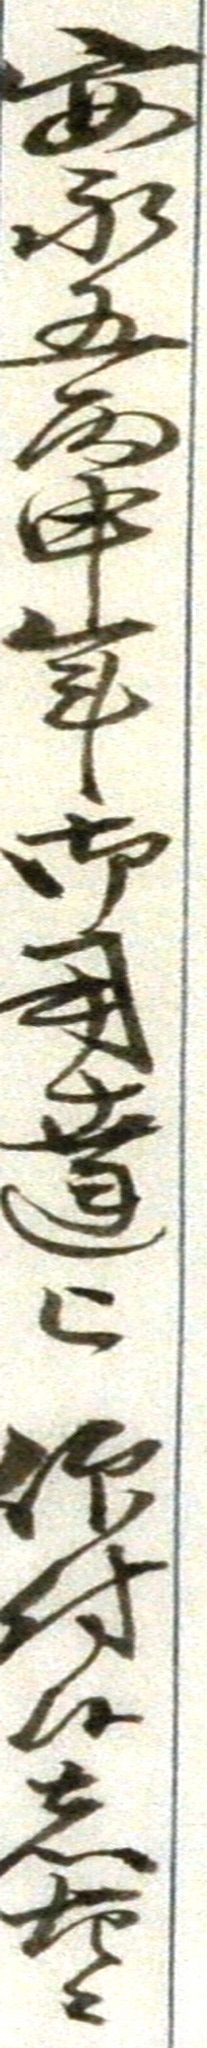安永五丙申年御用達被仰付候者左ニ
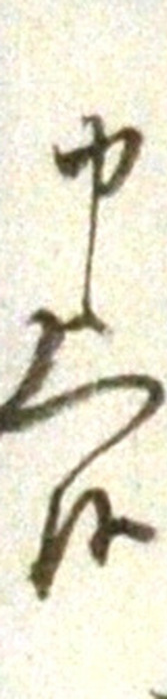申上候
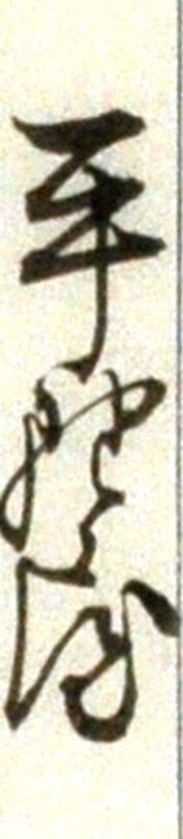平野屋
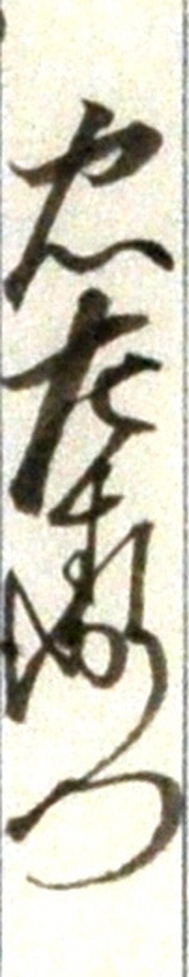忠左衛門
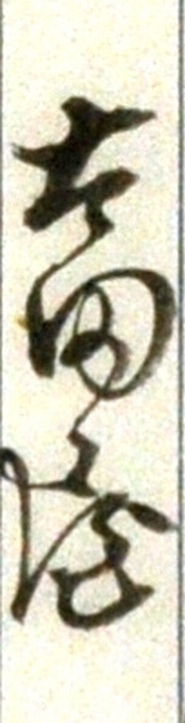太田屋
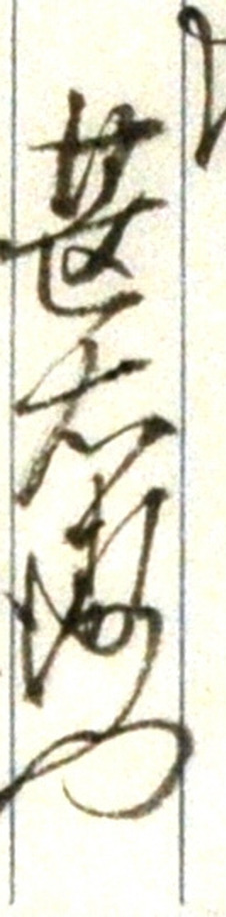甚右衛門
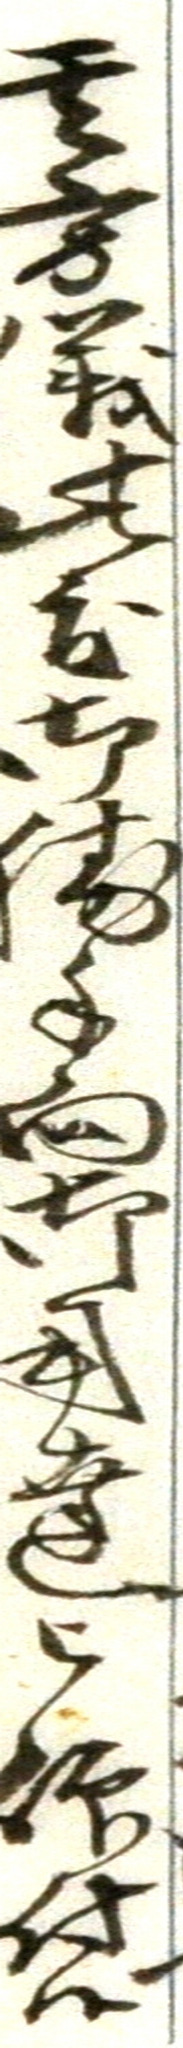其方儀此度御勝手向御用達被仰付候
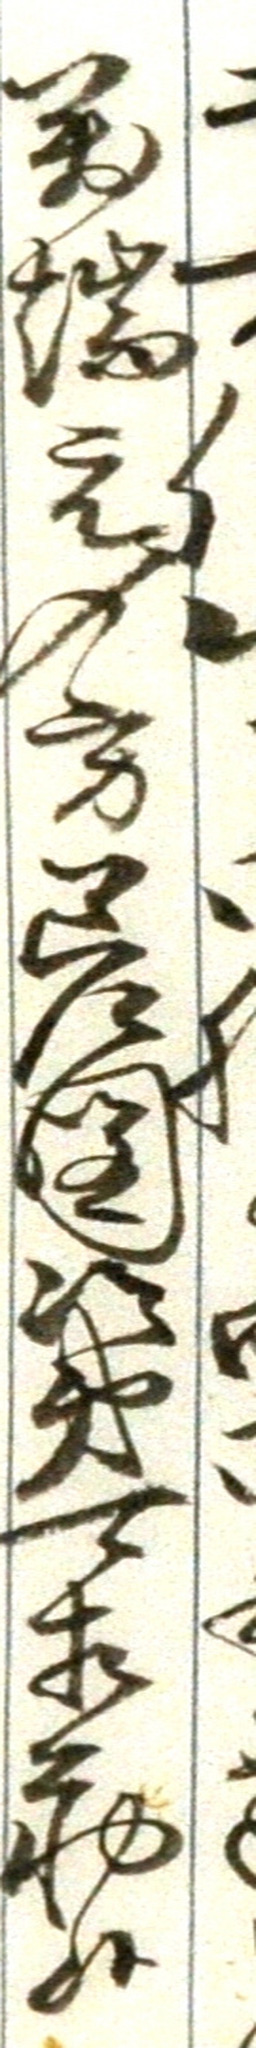万端元〆方差図次第可相勤候
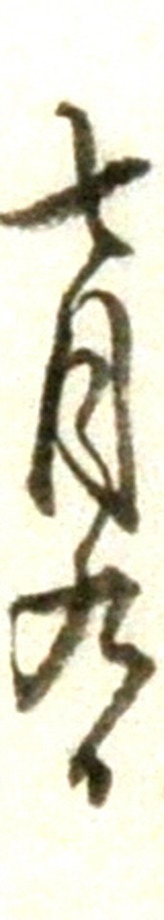七月九日
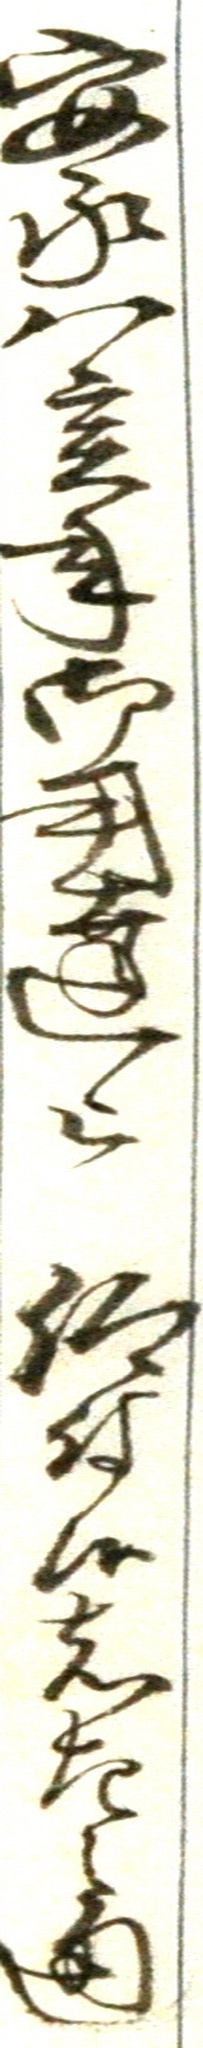安永八亥年御用達被仰付候者左之通

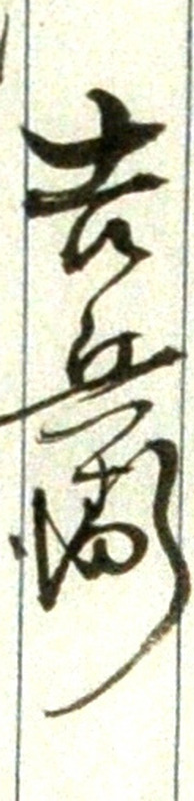吉兵衛
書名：御拝地以来御用達相勤候者名前
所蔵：伊那市立高遠町図書館・合同会社AMANE
